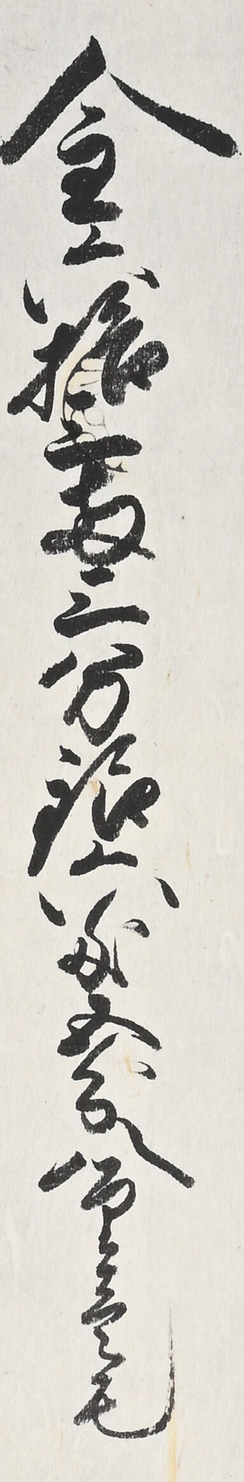金六拾三両三分銀六匁五分八厘壱毛
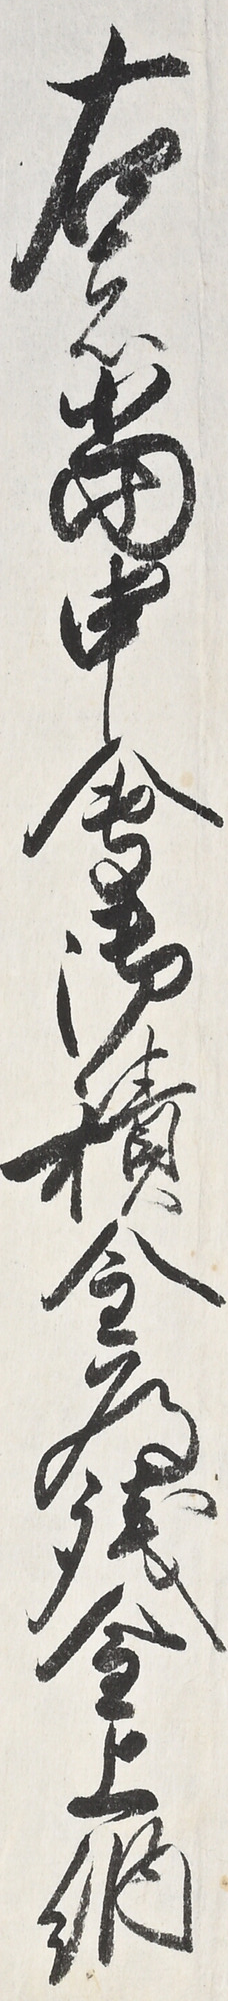右者当申会御積金為残金上納
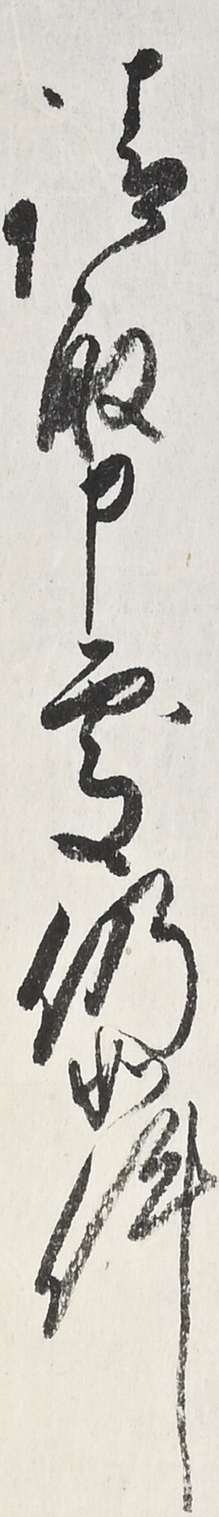請取申処仍如件
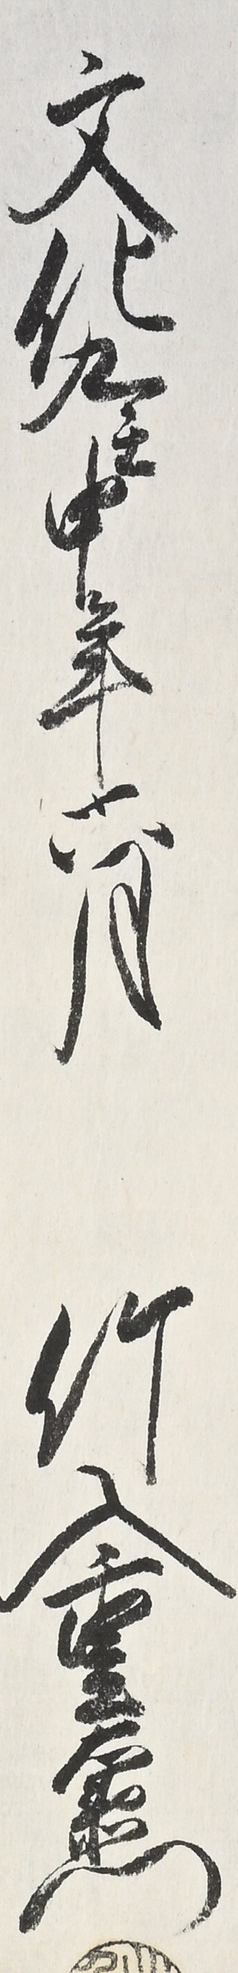文化九壬申年正月竹入重右衛門㊞
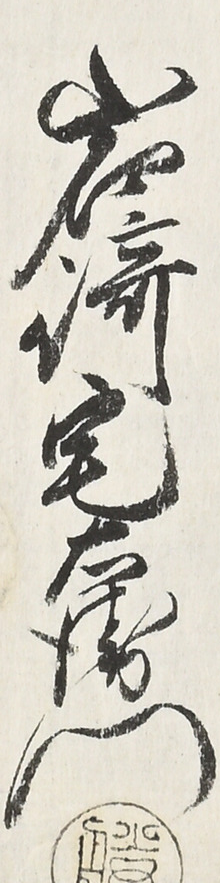岩崎宅右衛門㊞
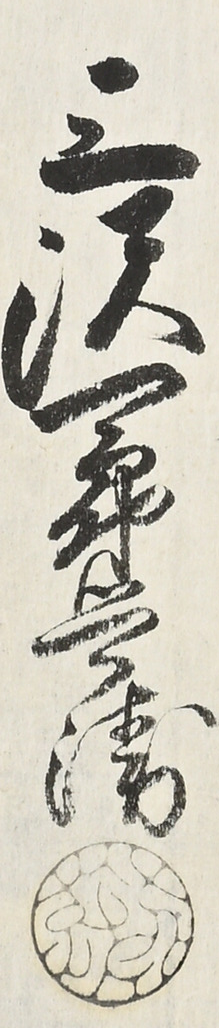三沢一郎兵衛㊞
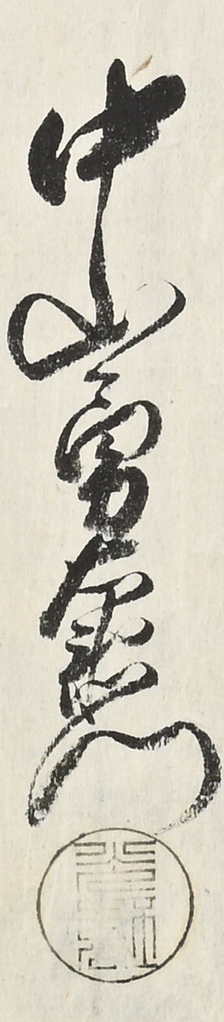中山勇右衛門㊞
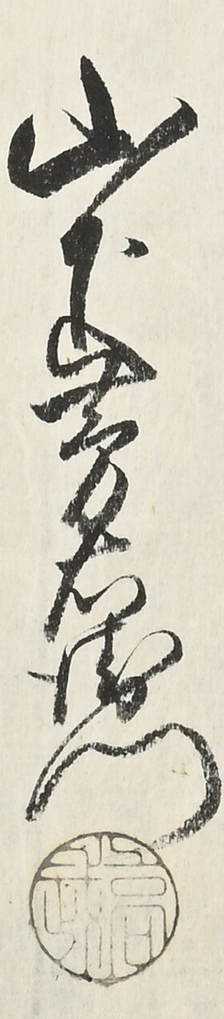山下芳右衛門㊞
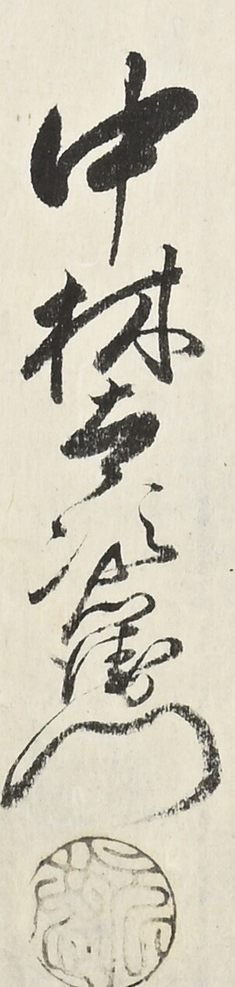中林太次右衛門㊞
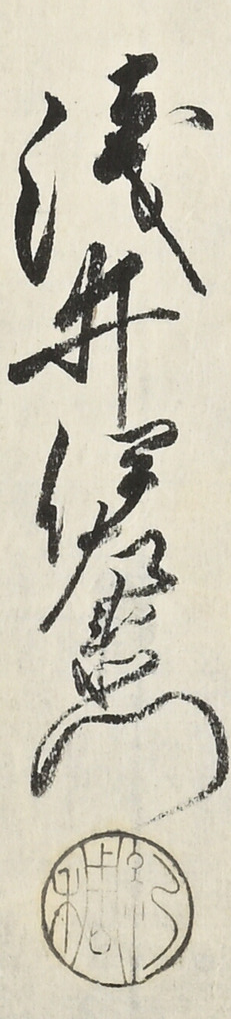浅井伊左衛門㊞
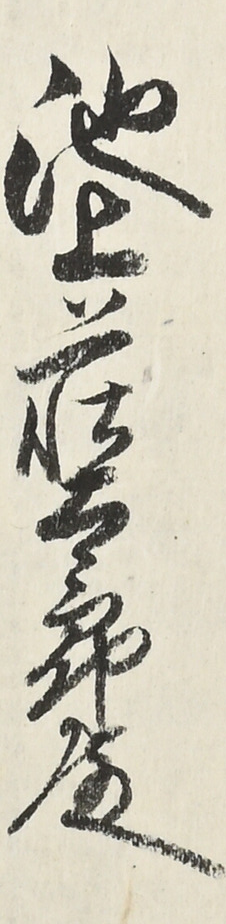池上荘太郎殿
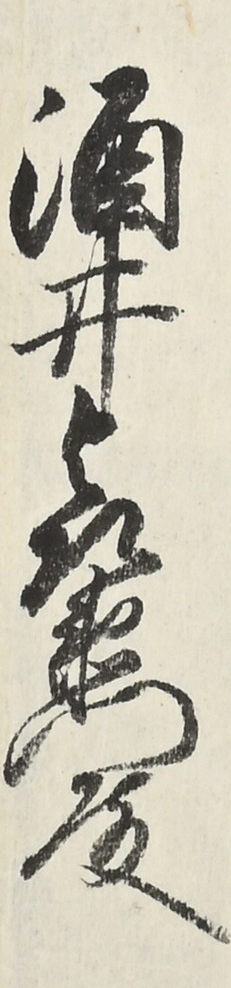酒井喜衛門殿
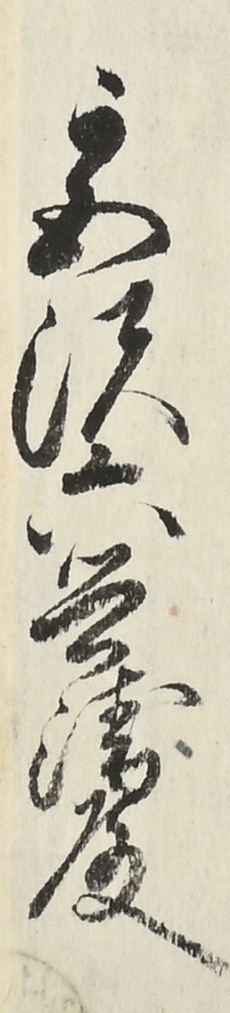宮沢六兵衛殿
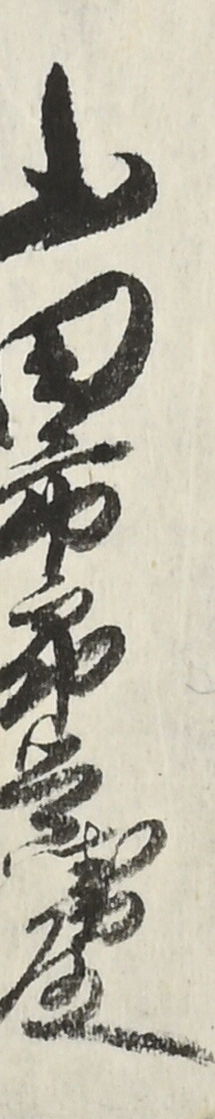山田市郎兵衛殿

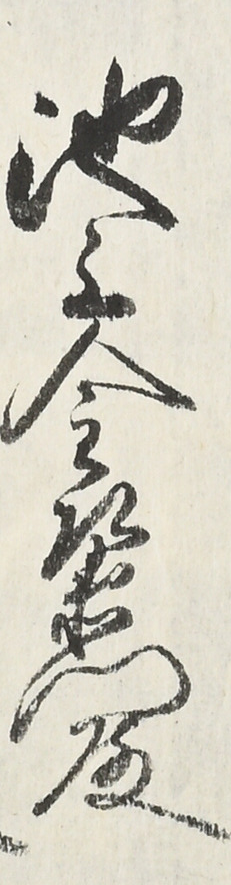池上金左衛門殿
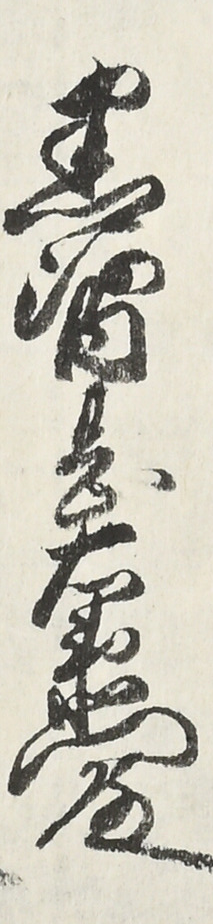黒河内甚右衛門殿
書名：覚
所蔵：伊那市立高遠町図書館・合同会社AMANE
